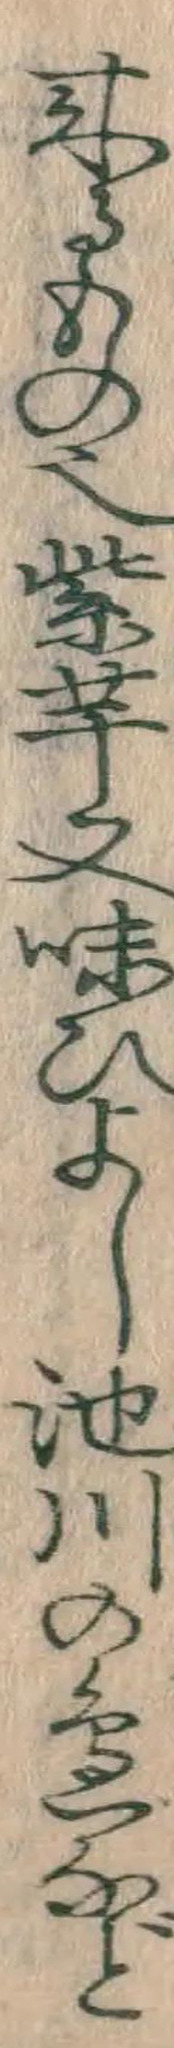来るもの也紫芋又味ひよし池川の辺など
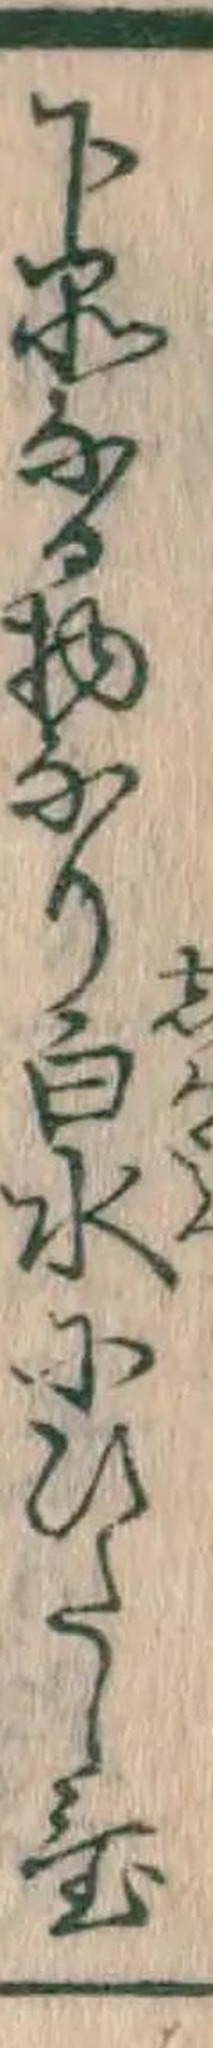下品なる物なり白水にひたし置
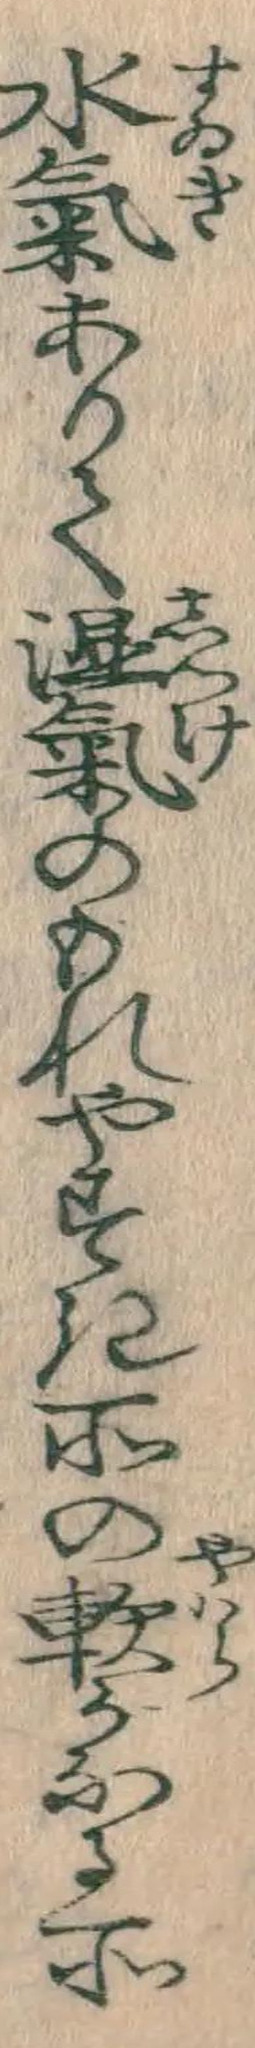水気ありて湿気のもれやすき所の軟かなる所
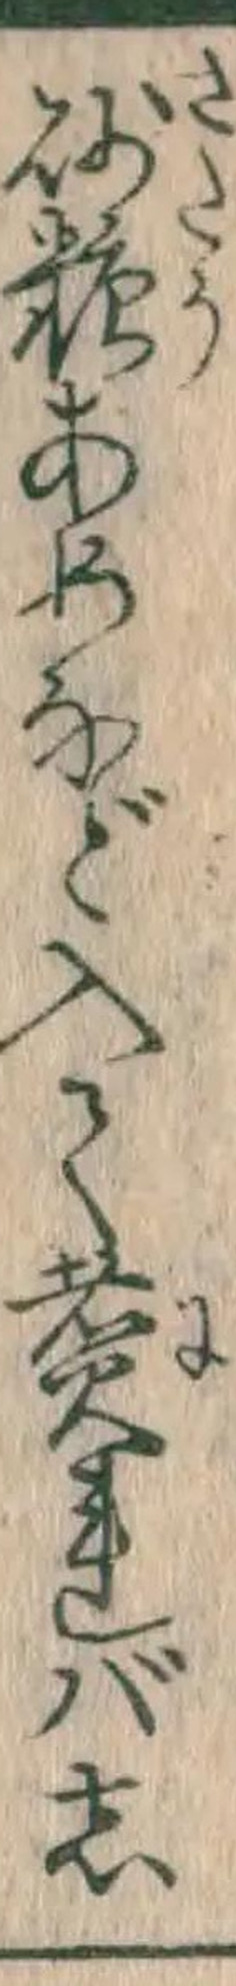砂糖あめなど入て煮ればし
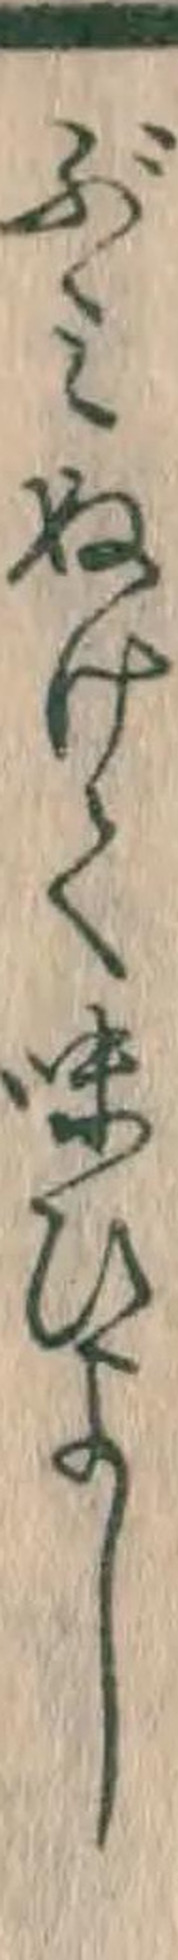ぶみぬけて味ひよし
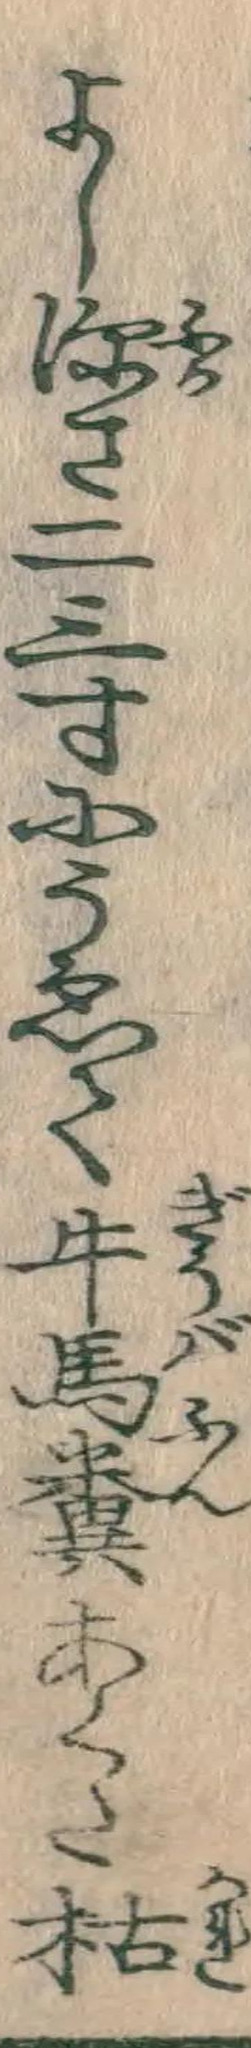よし深さ二三寸にうゑて牛馬糞のあくた枯
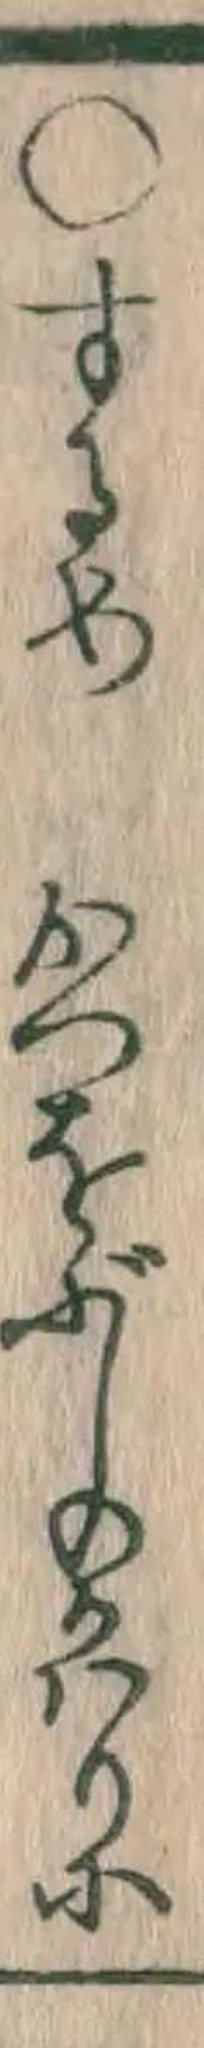○するめかつをぶしのかはりに
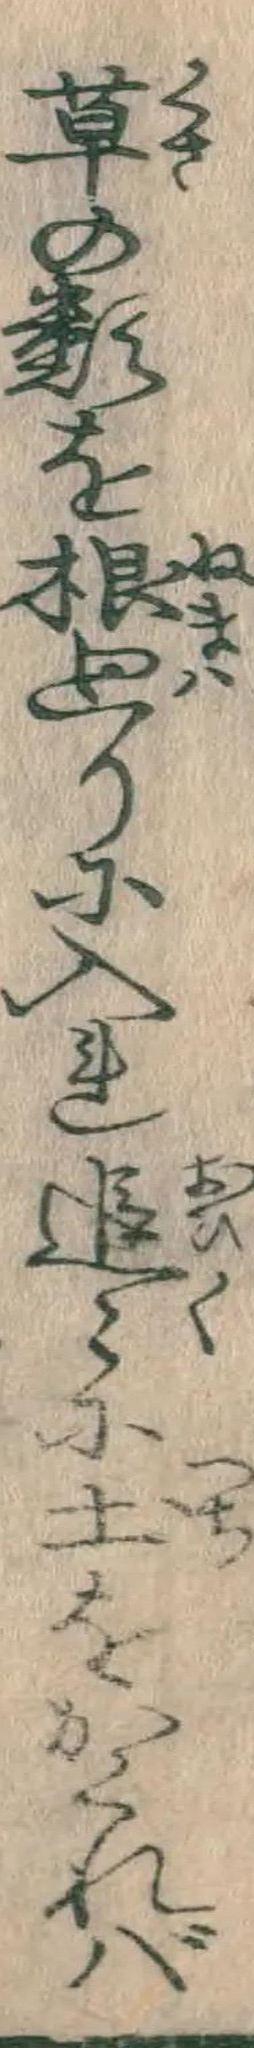草の類を根廻りに入れ追々に土をかくれば
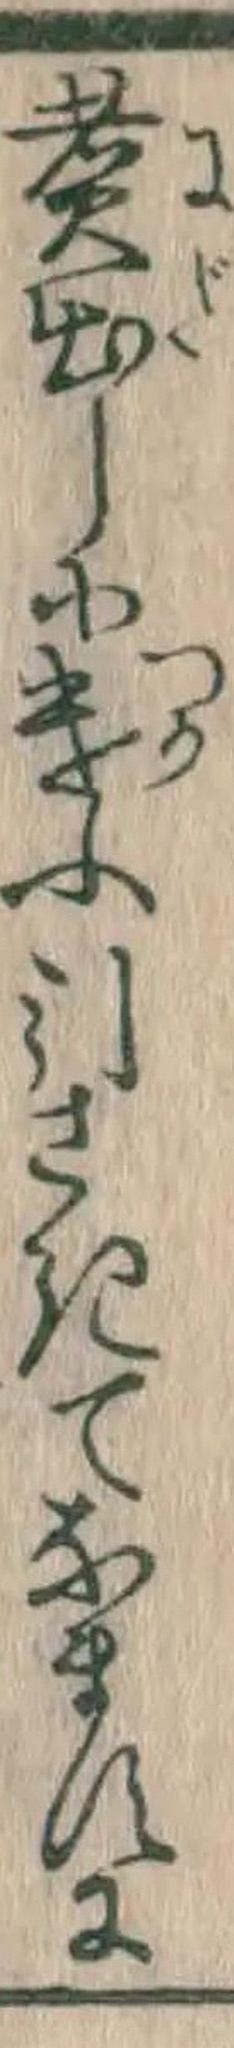煮出しに遣ふ引さきてなますに
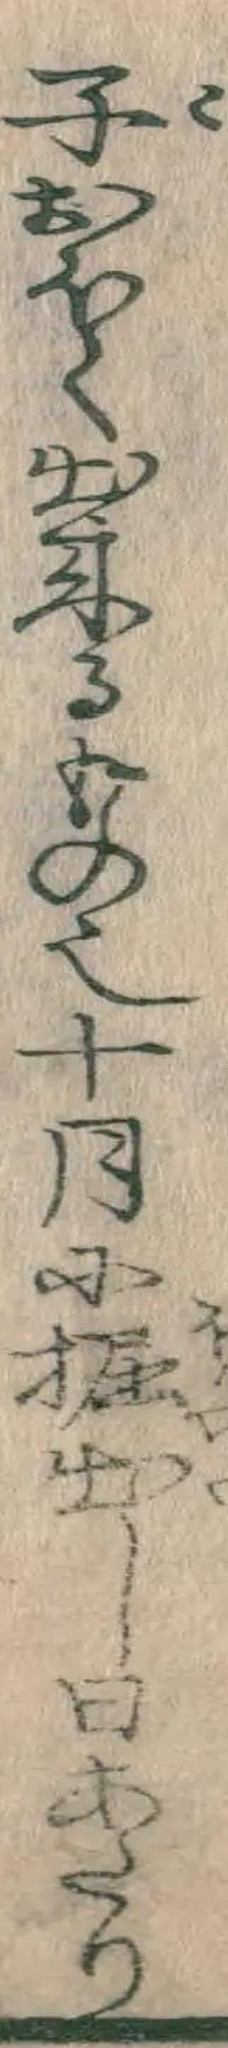子おほく出来るもの也十月に掘出し日あたり
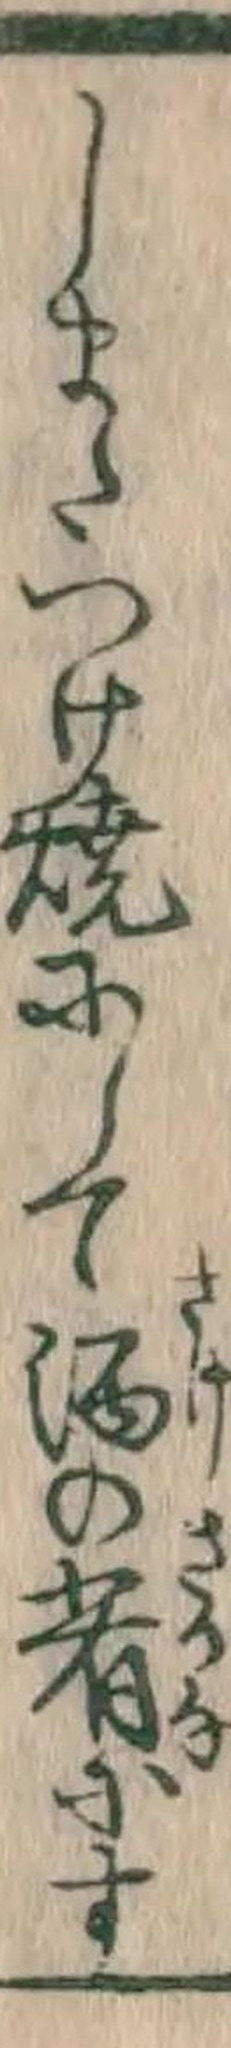しまたつけ焼にして酒の肴にす
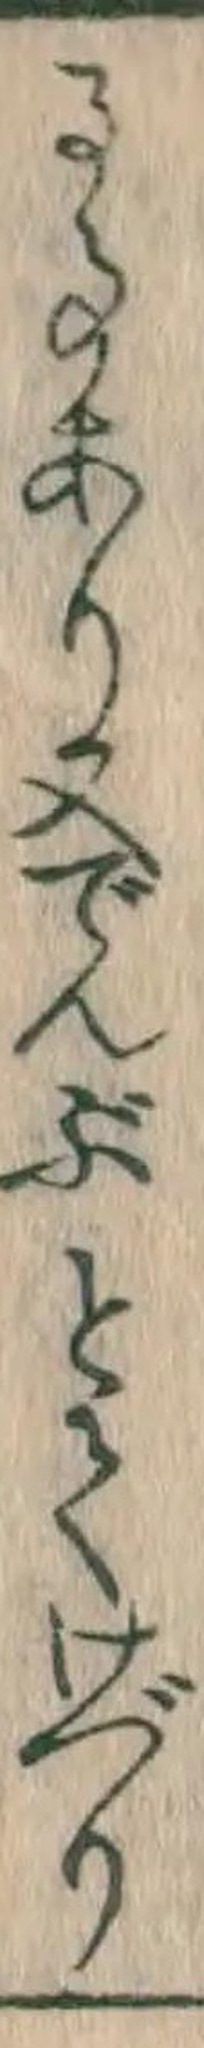る事あり又でんぶとてけづり
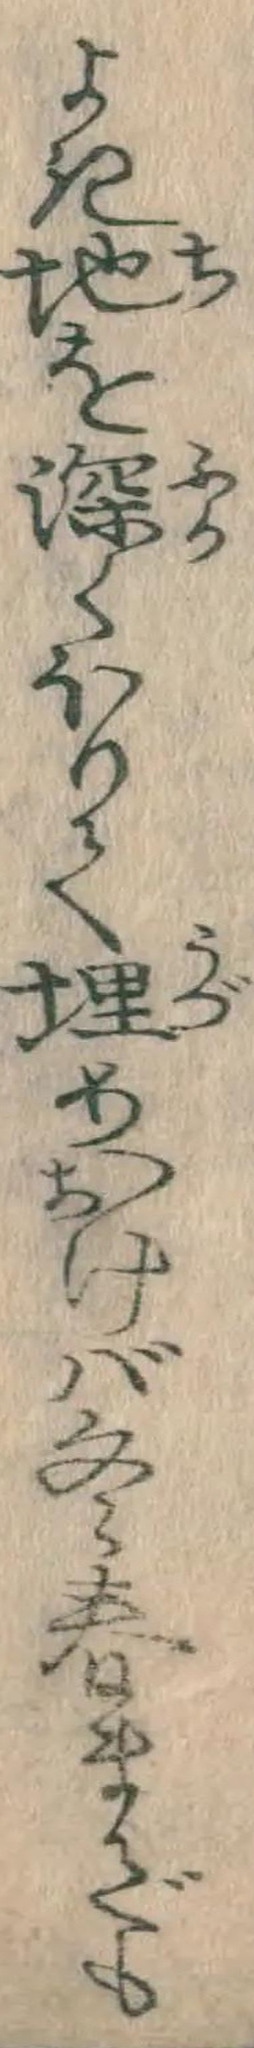よき地を深くほりて埋めおけば冬春までも
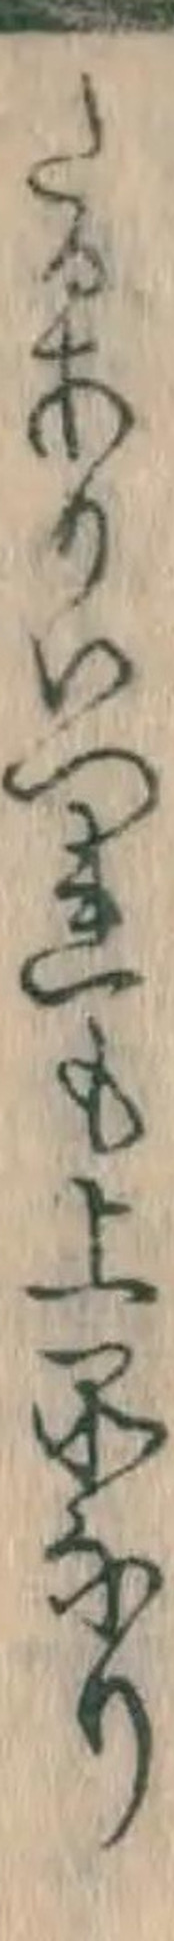たるありいつれも上品なり
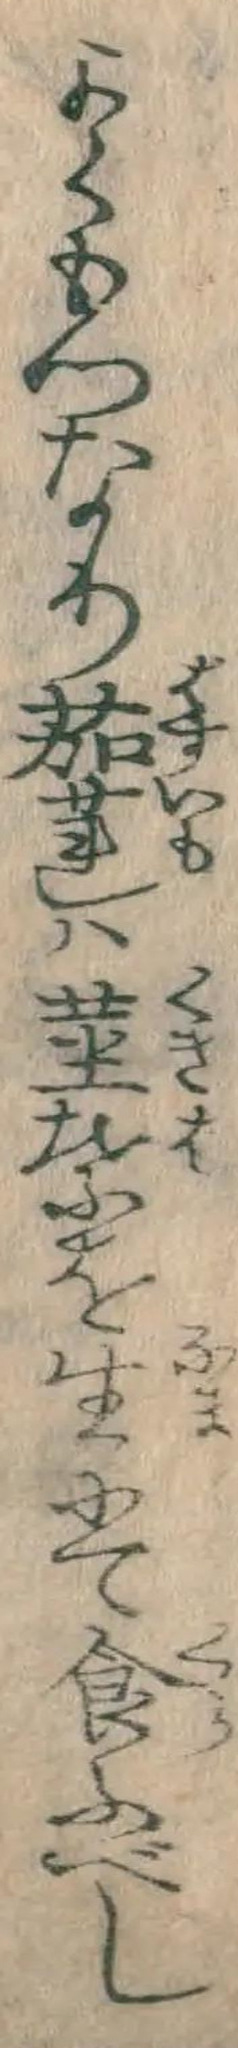よくもつなり茄蓮は茎葉を生にて食ふべし

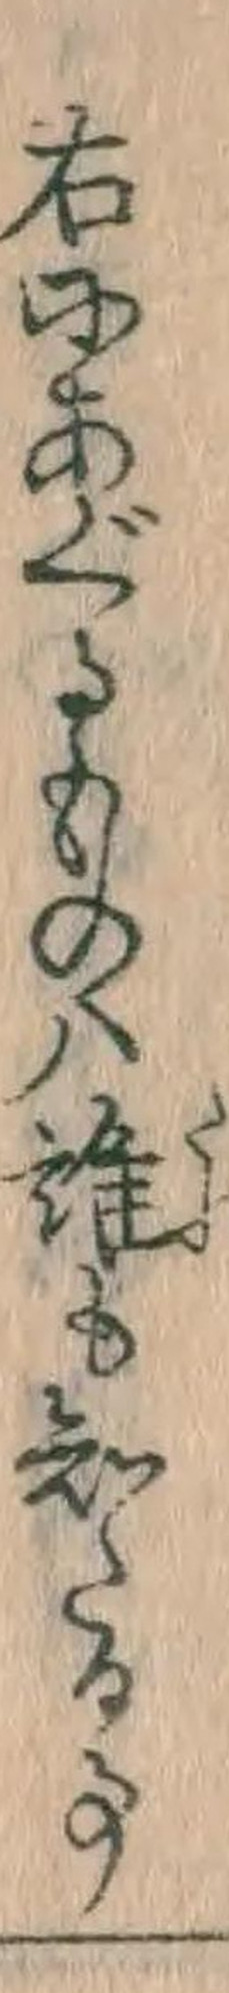右にあぐるものは誰も知たる事
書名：広益秘事大全 3巻. [5]
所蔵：国立国会図書館 National Diet Library, JAPAN
